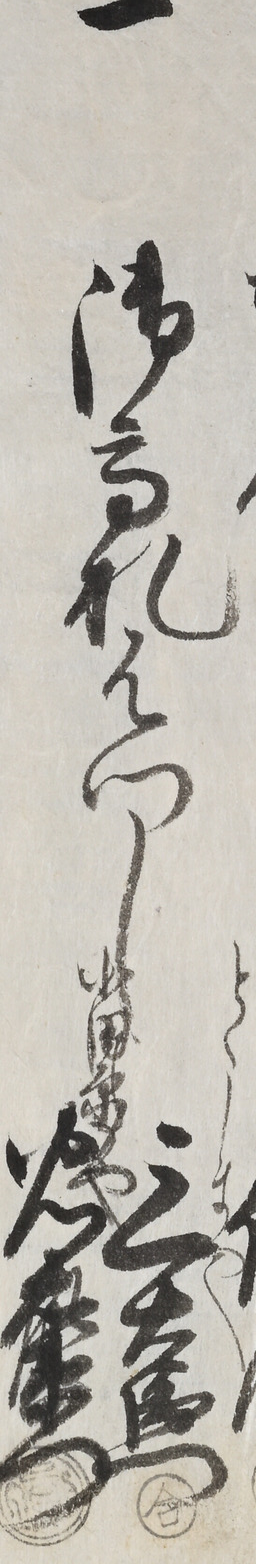一御高札はつし忠右衛門㊞

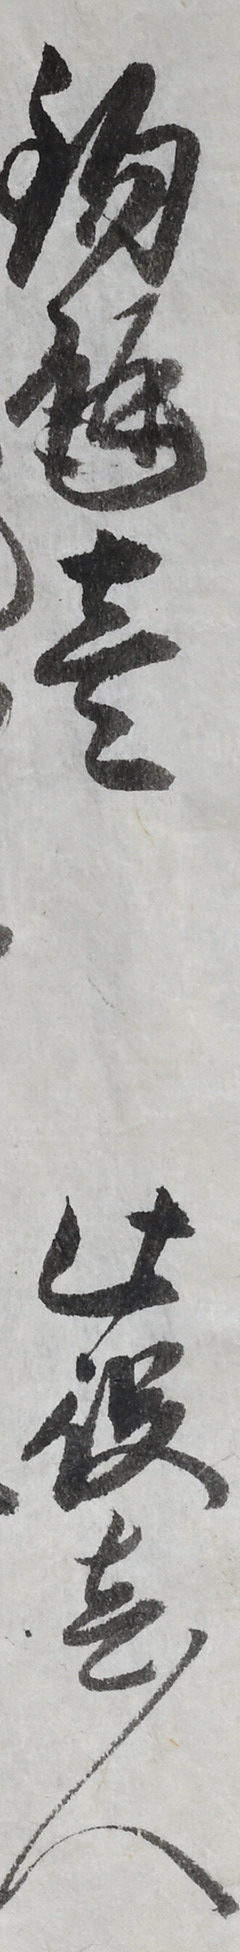鉋瓸壱此役壱人
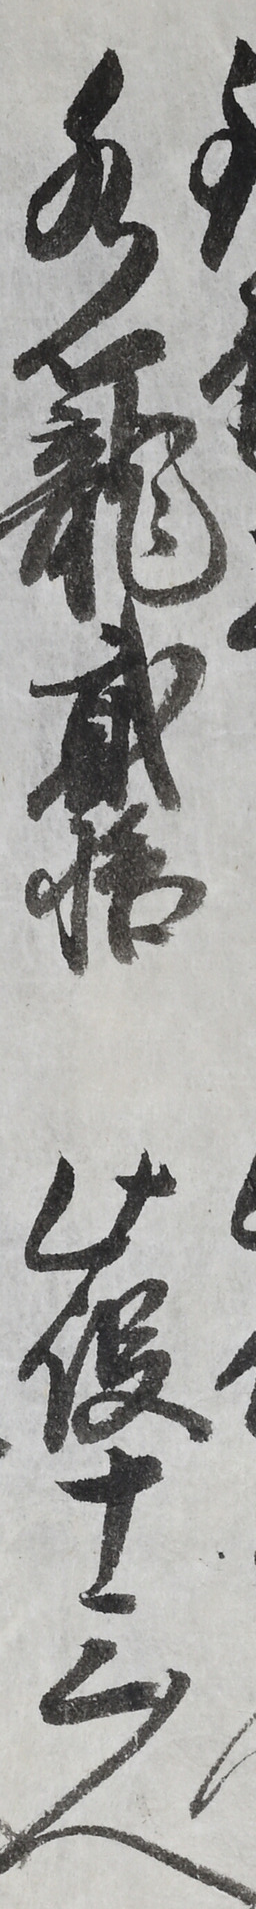水籠弐拾此役十三人
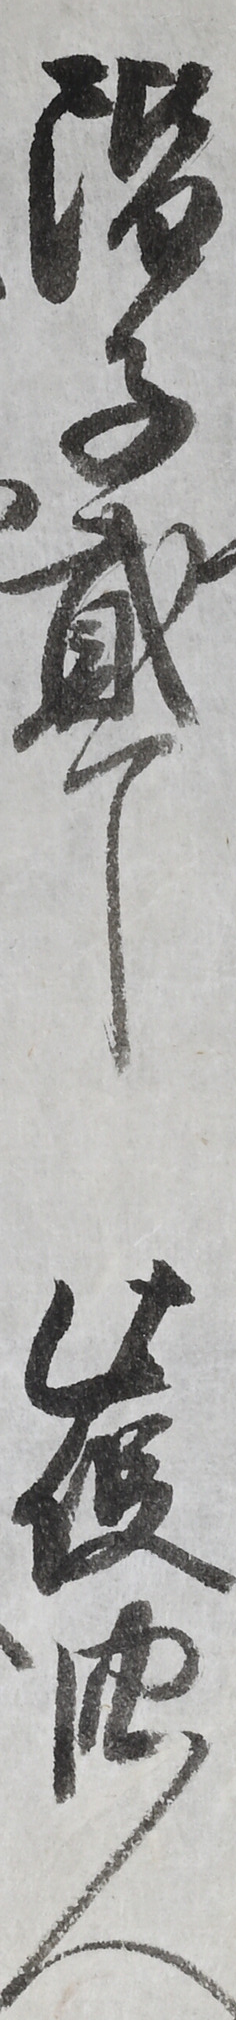階子弐丁此役四人
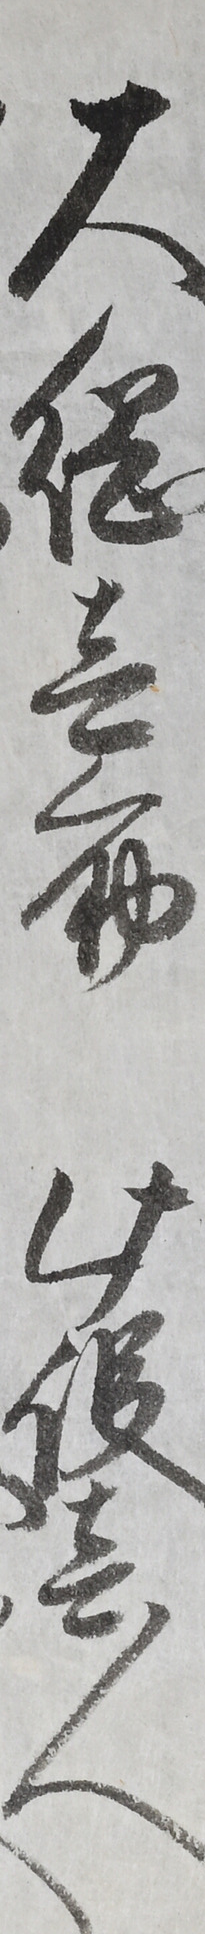大綱壱筋此役壱人
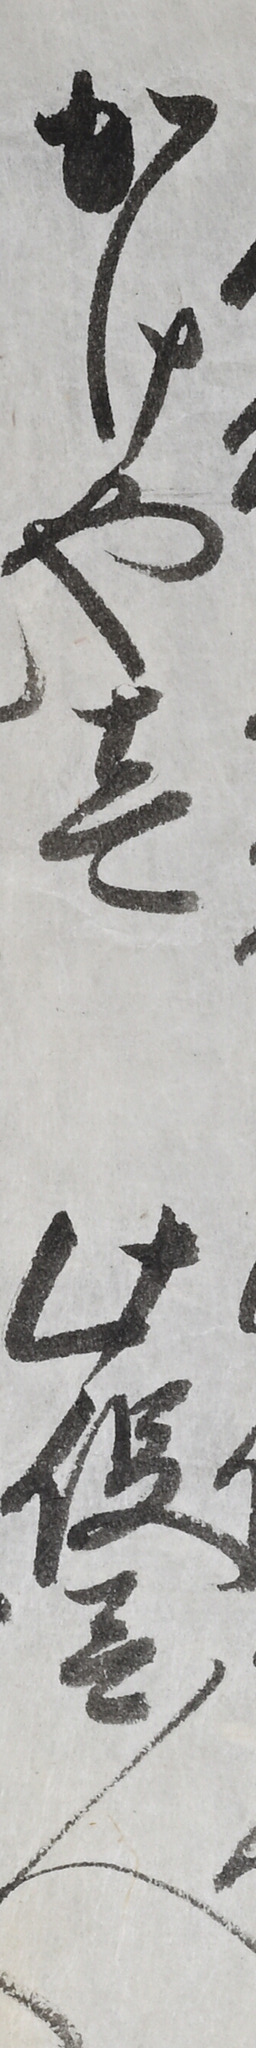かけや壱此役壱人
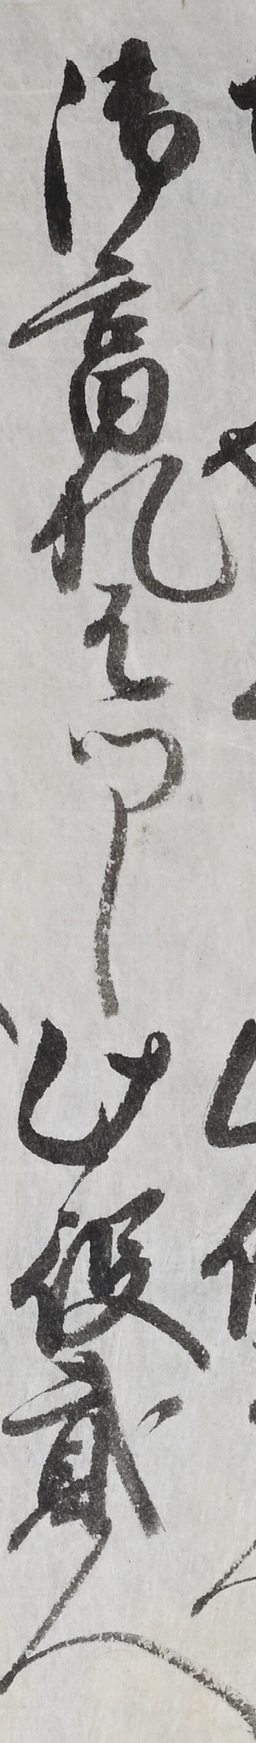御高札はつし此役弐人
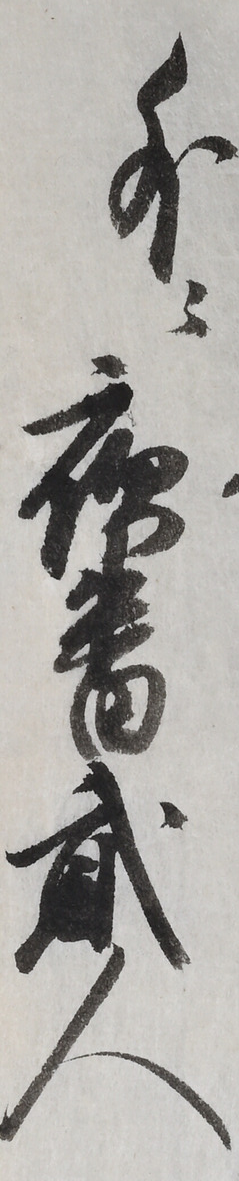外ニ夜番弐人
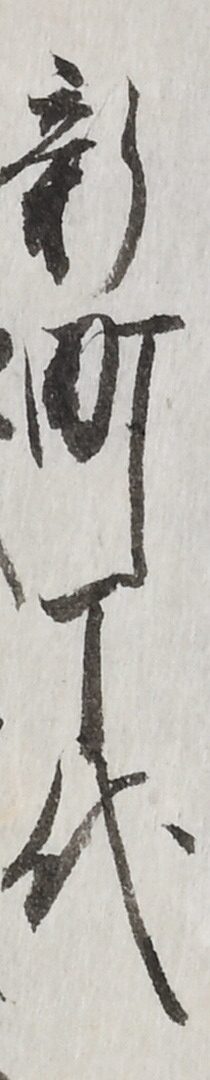新町丁代
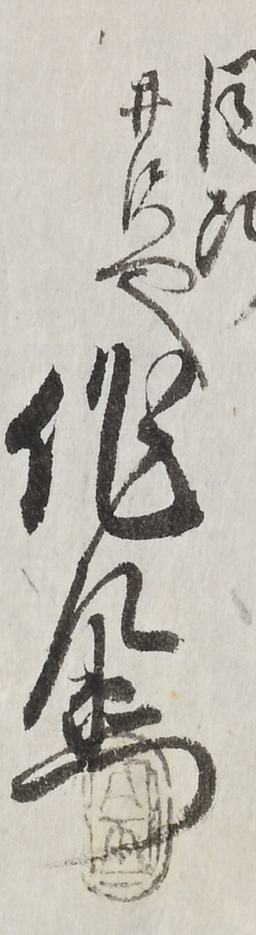井沢や作左衛門㊞
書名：當町火消道具幷役付帳
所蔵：伊那市立高遠町図書館・合同会社AMANE
